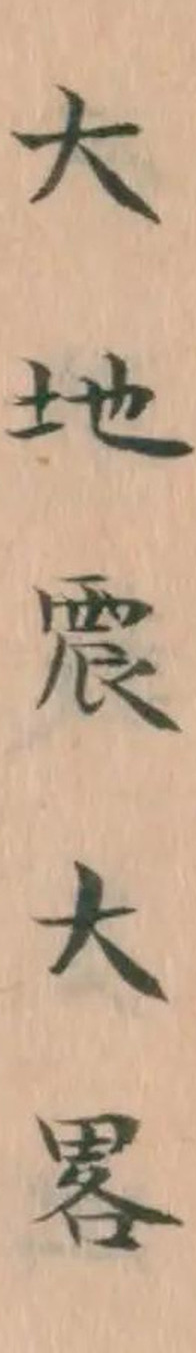大地震大畧
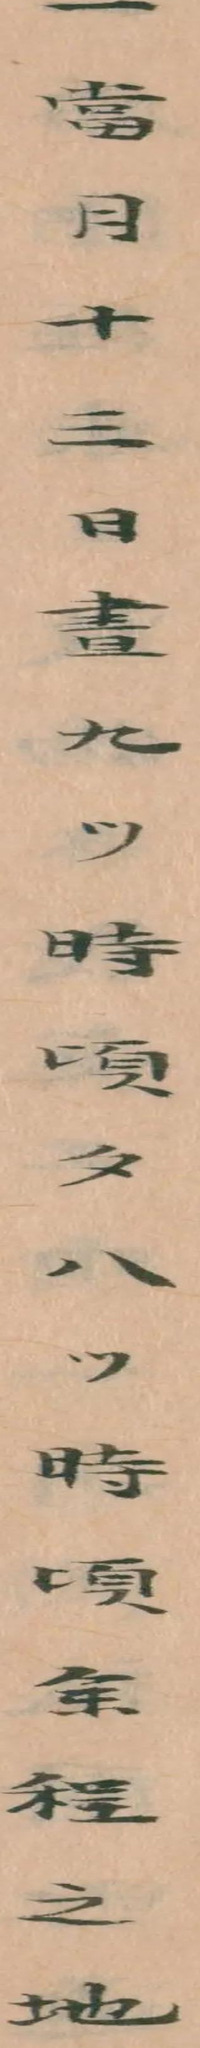一当月十三日晝九ッ時頃夕八ッ時頃余程之地
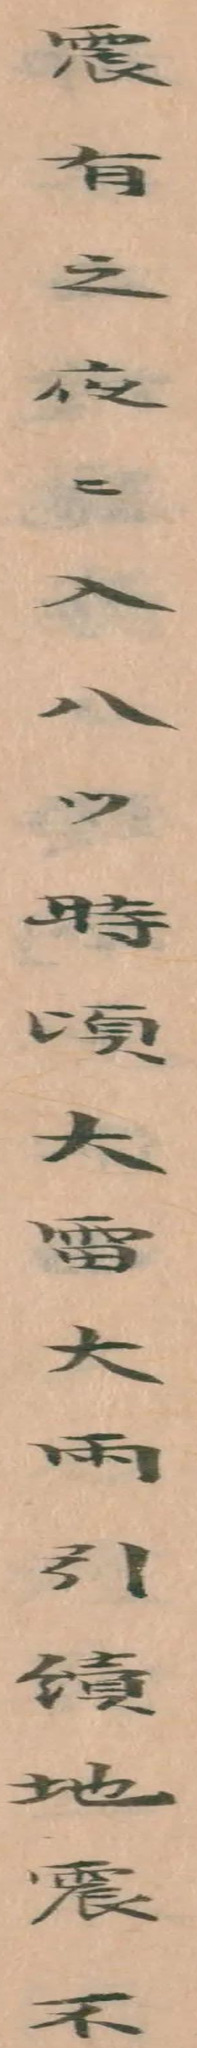震有之夜二入八ッ時頃大雷大雨引続地震不
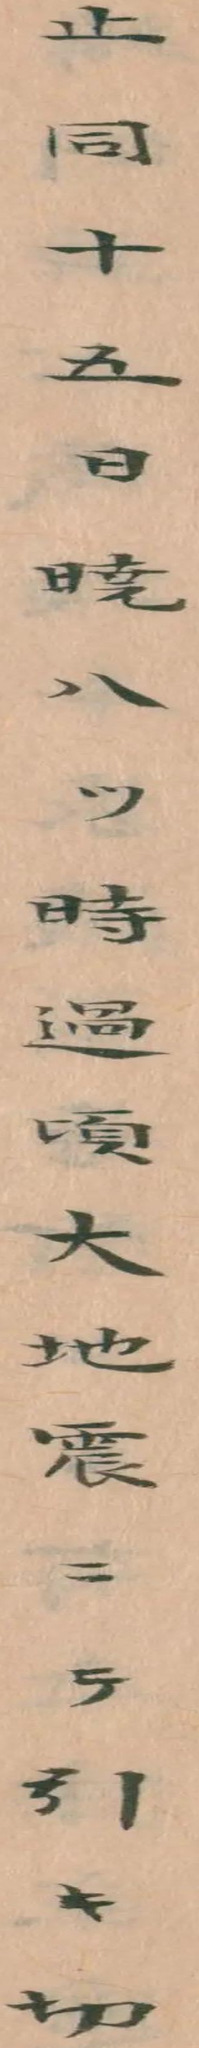止同十五日暁八ッ時過頃大地震二テ引キ切
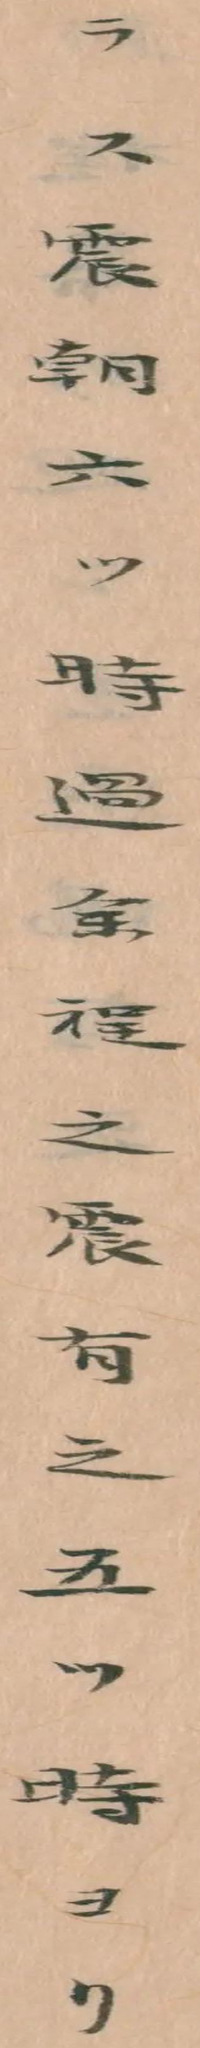ラス震朝六ッ時過余程之震有之五ッ時ヨリ
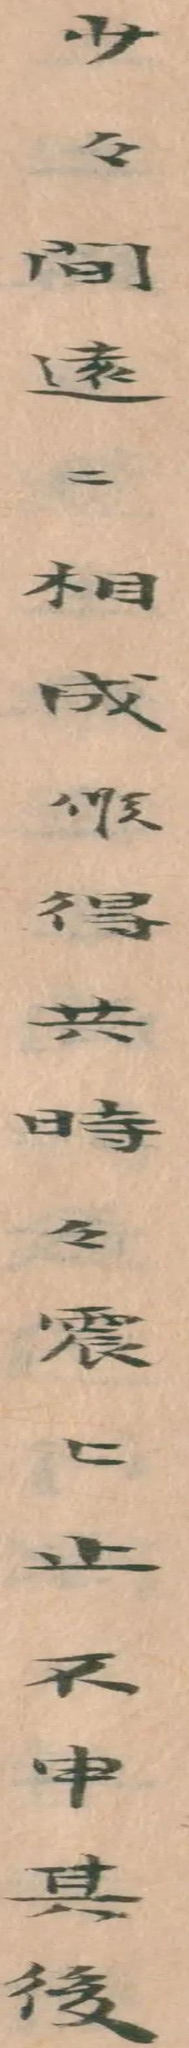少々間遠二相成候得共時々震ヒ止不申其後
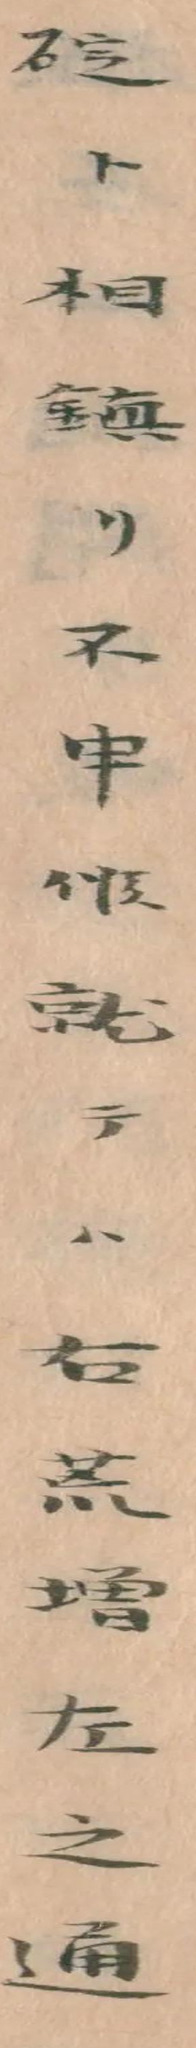碇ト相鎮リ不申候就テハ右荒増左之通
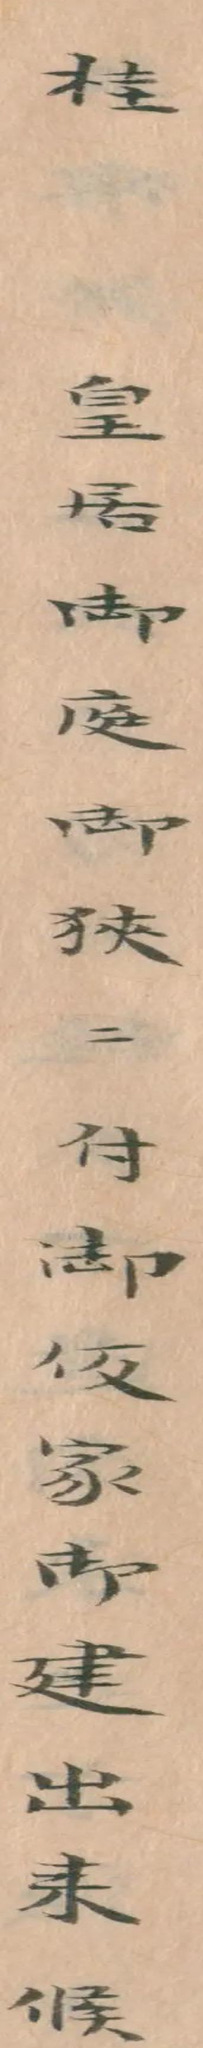一桂皇居御庭御狭二付御仮家御建出来候
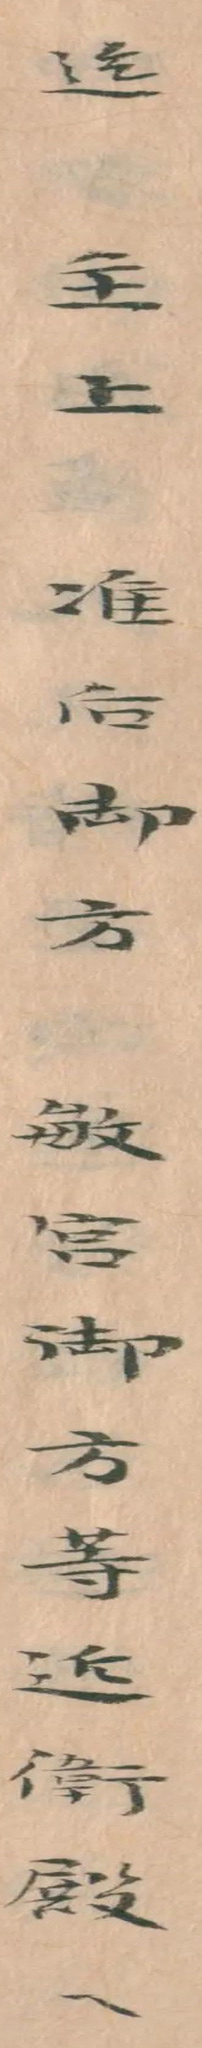迄主上准后御方敏宮御方等近衛殿へ
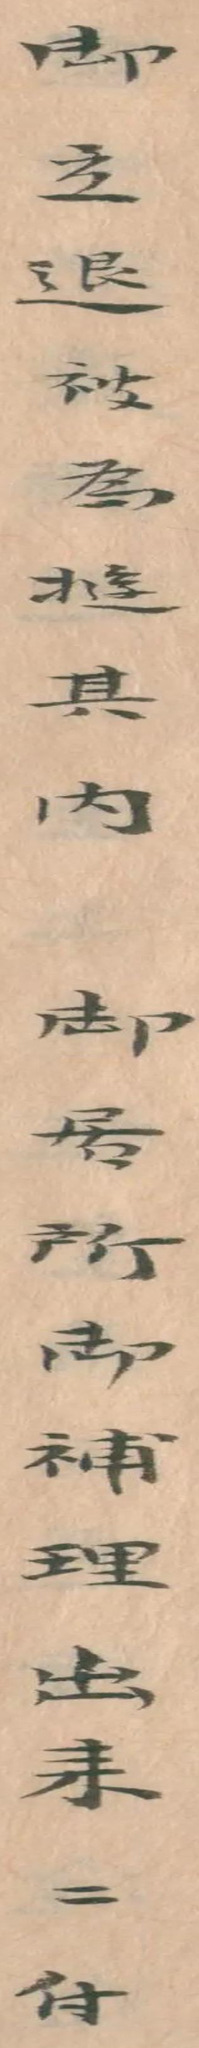御立退被為遊其内御居所御補理出来二付

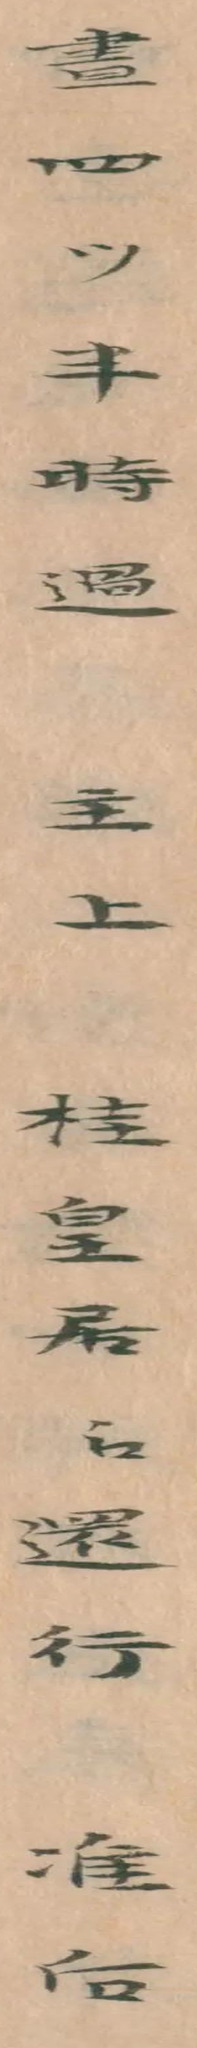晝四ッ半時過主上桂皇居江還行准后
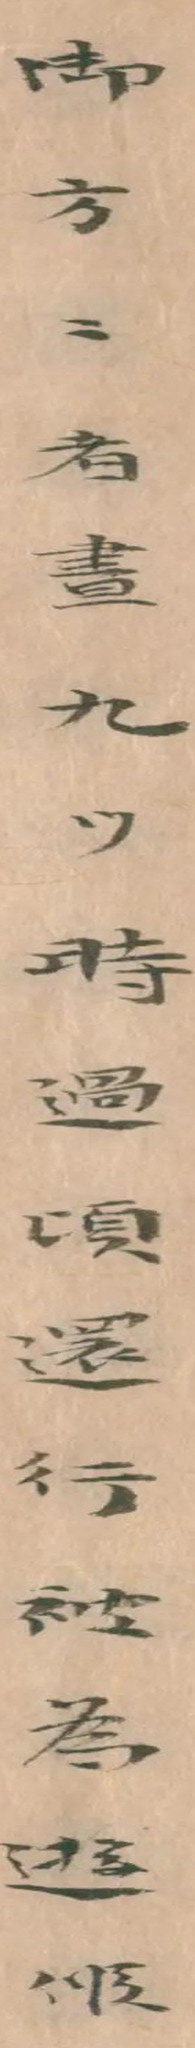御方二者晝九ッ時過頃還行被為遊候
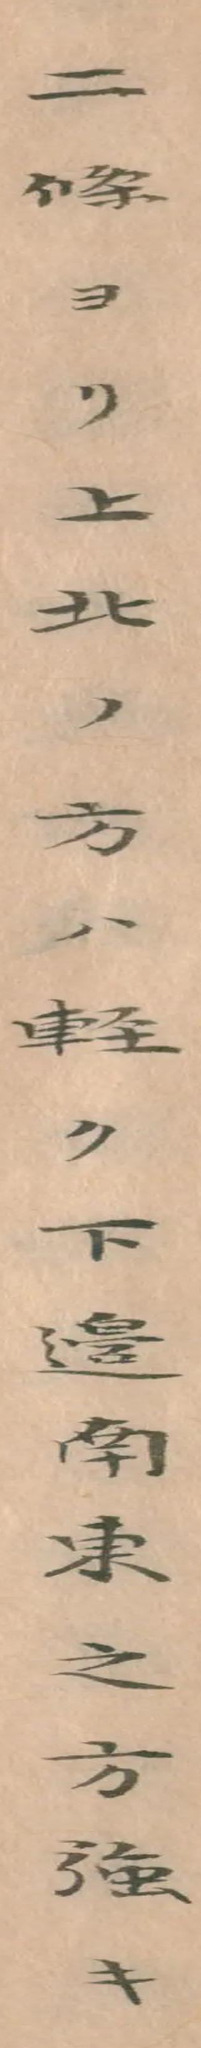一二條ヨリ上北ノ方ハ軽ク下辺南東之方強キ
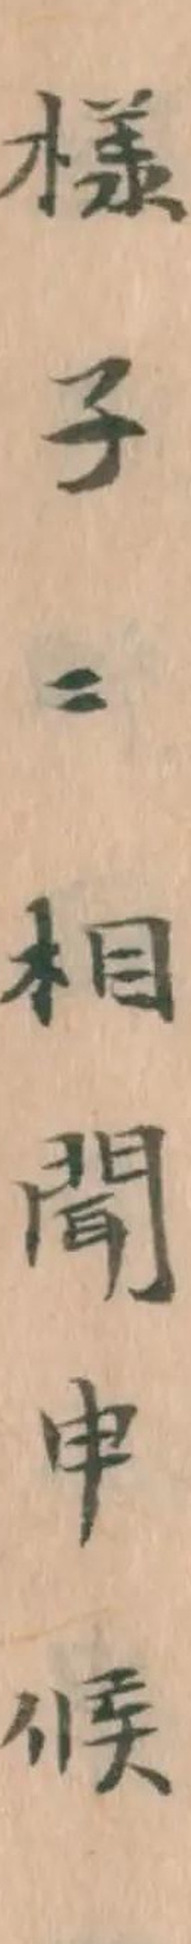様子二相聞震候
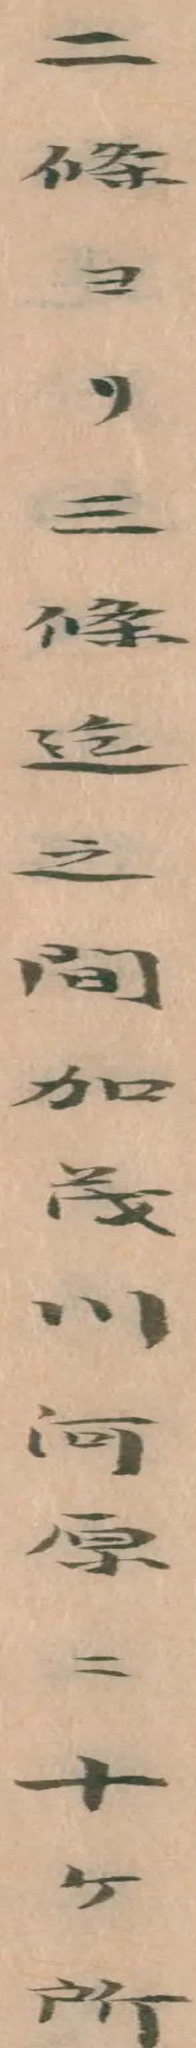二條ヨリ三條迄之間加茂川河原二十ヶ所
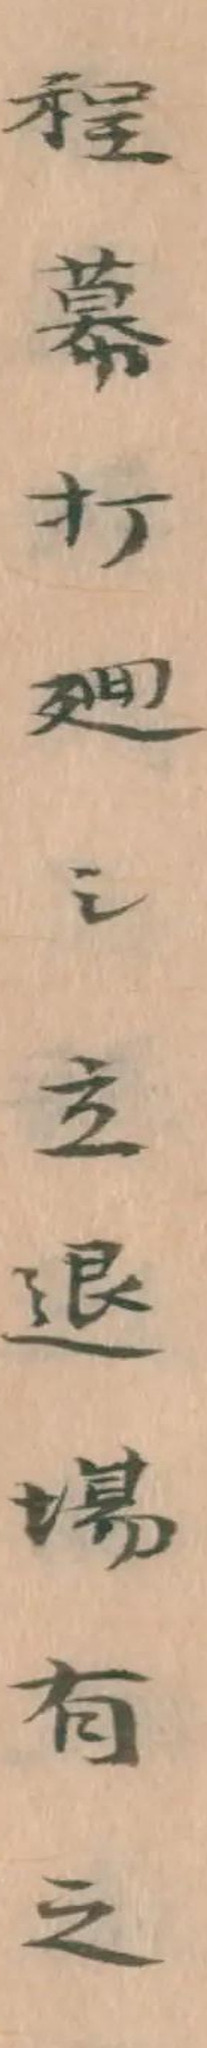程幕打廻シ立退場有之
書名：地災撮要. 巻1(噴火山・地震ノ部)
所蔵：国立国会図書館 National Diet Library, JAPAN
